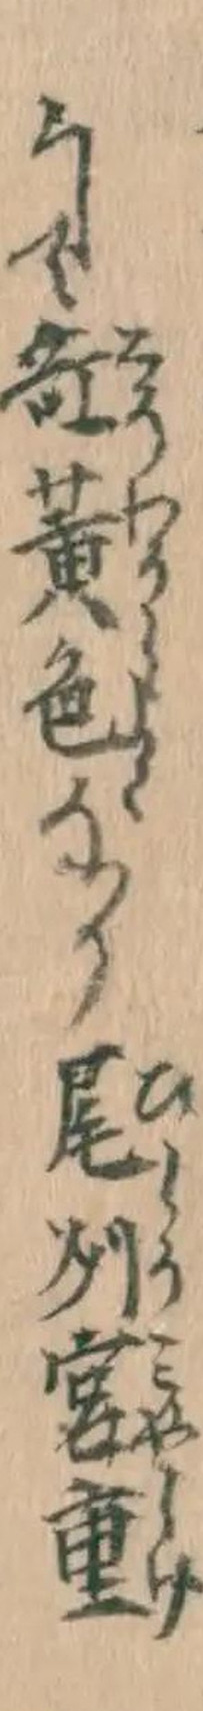くして紅黄色なり尾州宮重
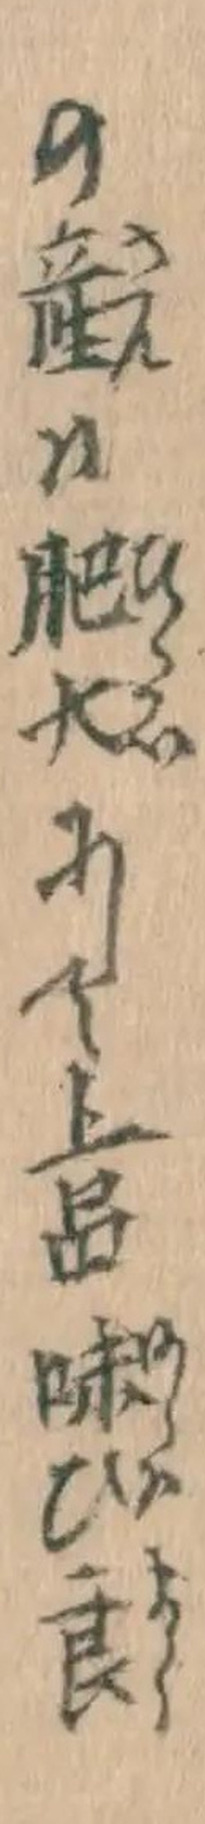の産は肥大にして上品味ひ良
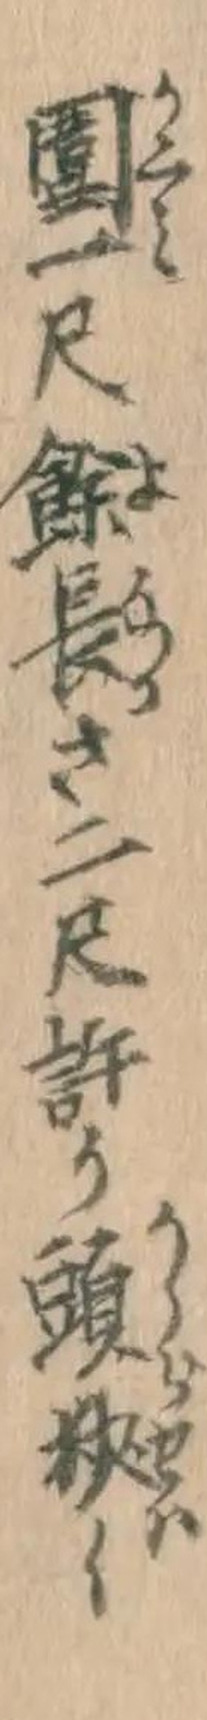囲一尺余長さ二尺許り頭狭く
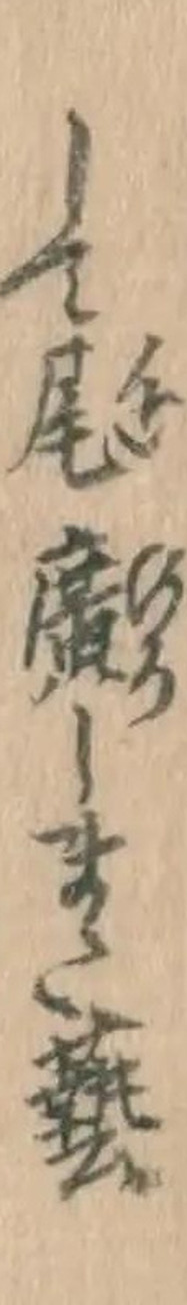して尾広しまた芸
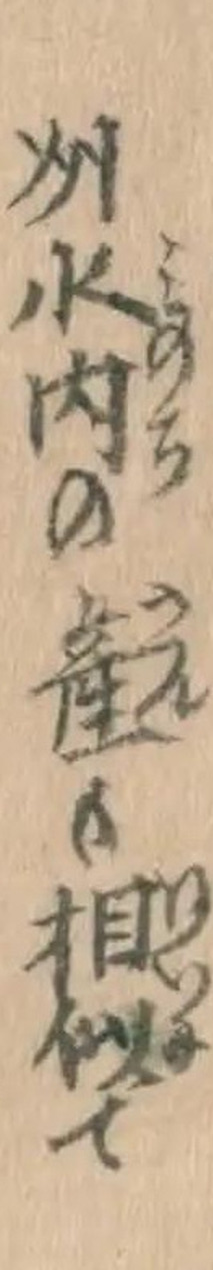州水内の産も相似て
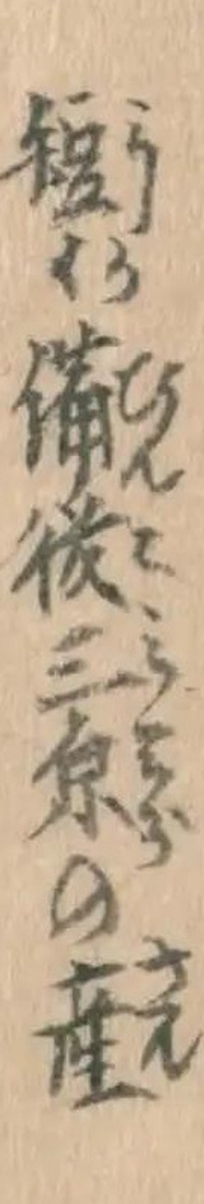短く備後三原の産
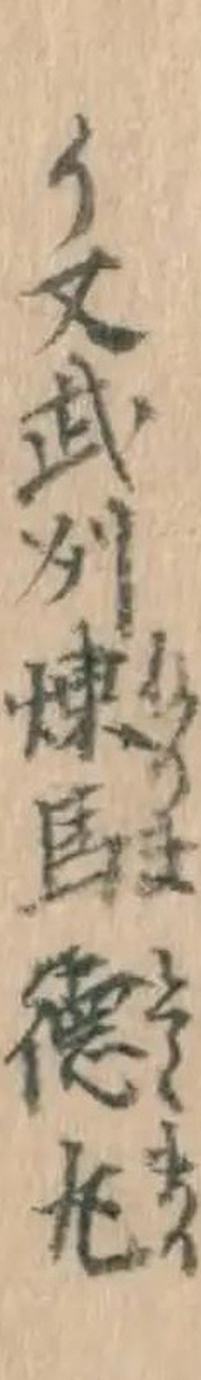り又武州煉馬徳丸
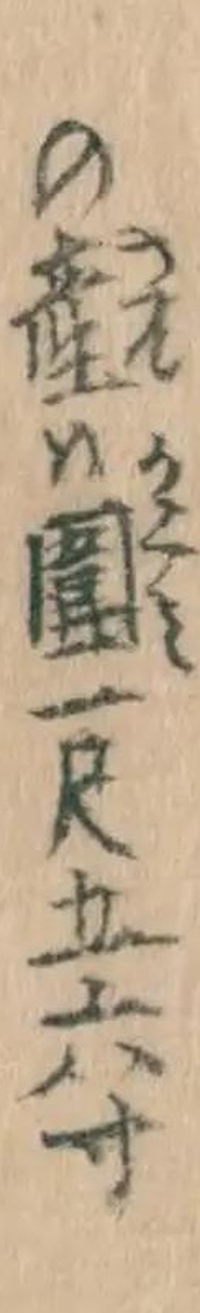の産は囲一尺五六寸
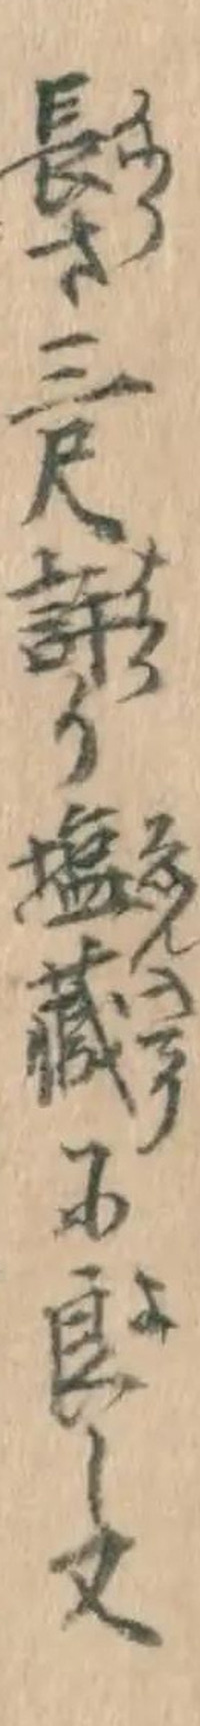長さ三尺許り塩蔵に良し又
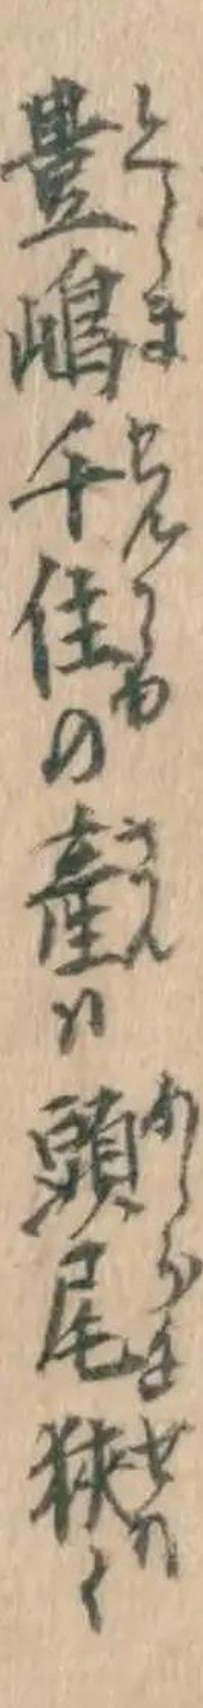豊嶋千住の産は頭尾狭く
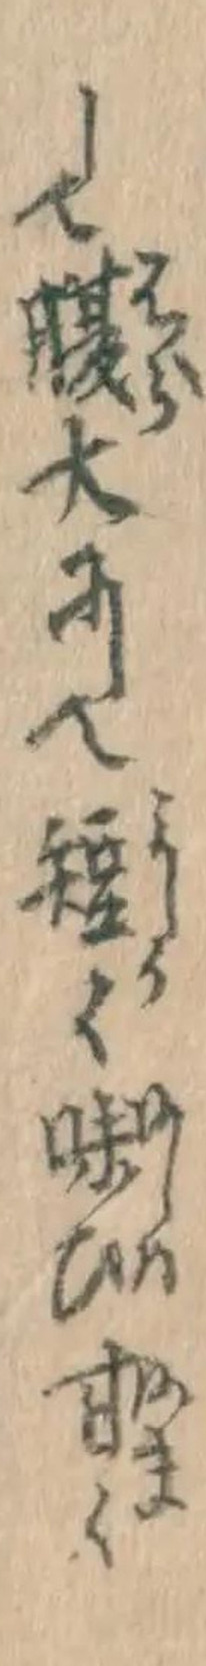して腹大にして短く味ひ甘く
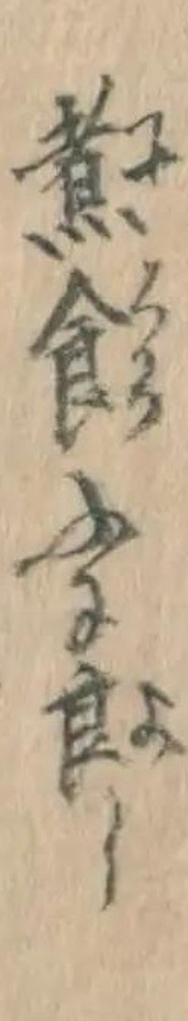煮食ふに良し

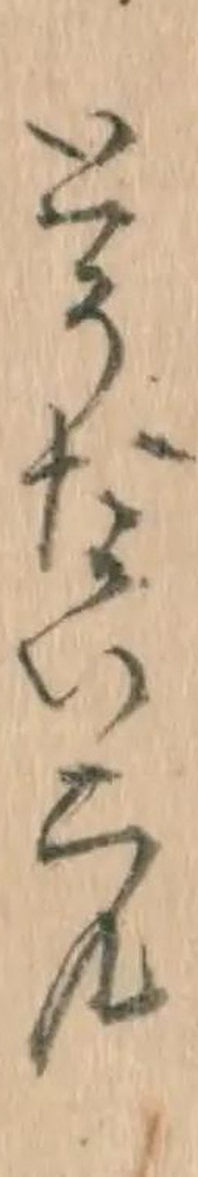とうだいこん
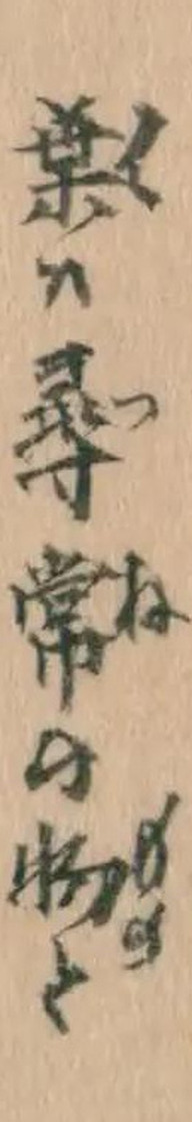葉は尋常の物と
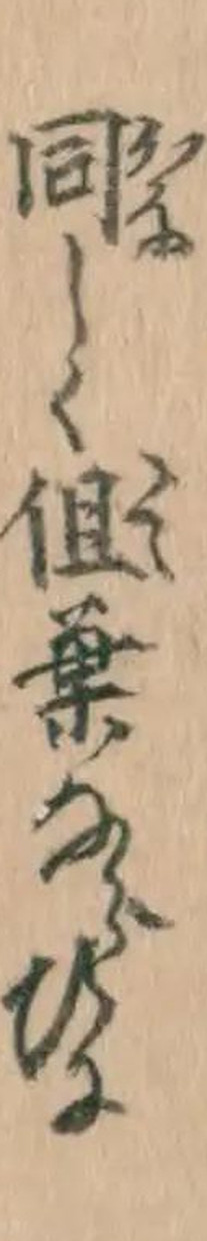同しく但葉ならひに
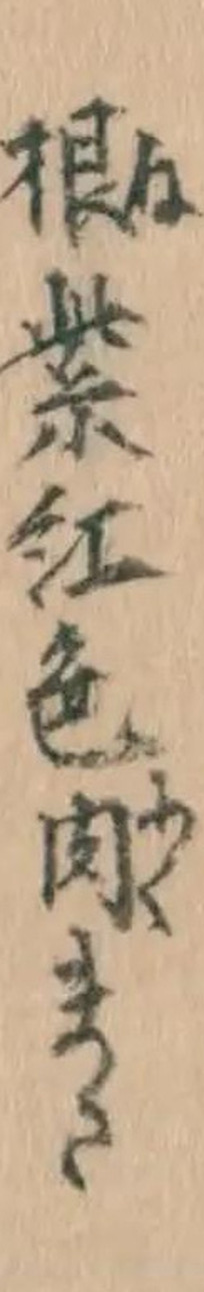根紫紅色肉また
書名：本草図譜. 巻46-48
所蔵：国立国会図書館 National Diet Library, JAPAN
